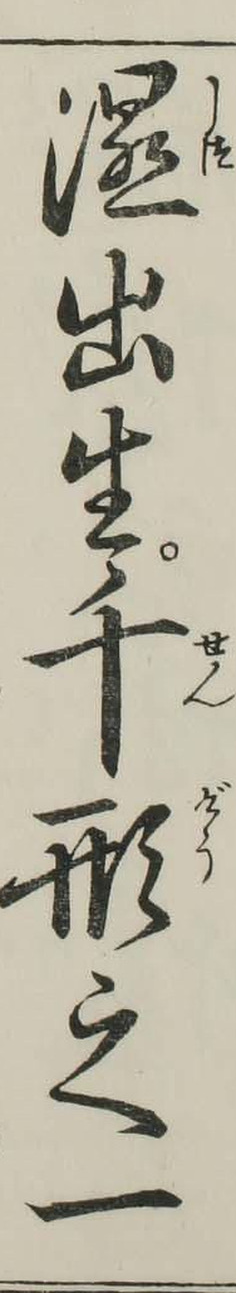湿出生。千形之一
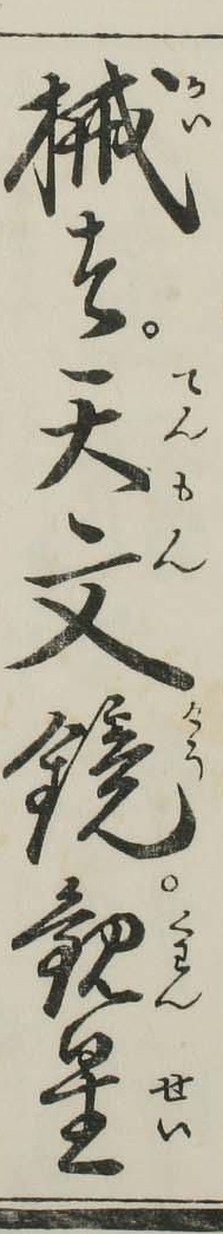械は。天文鏡。観星
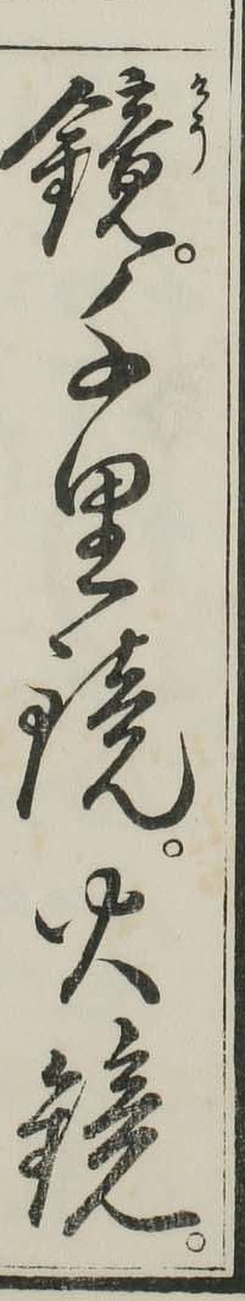鏡。千里鏡。火鏡。
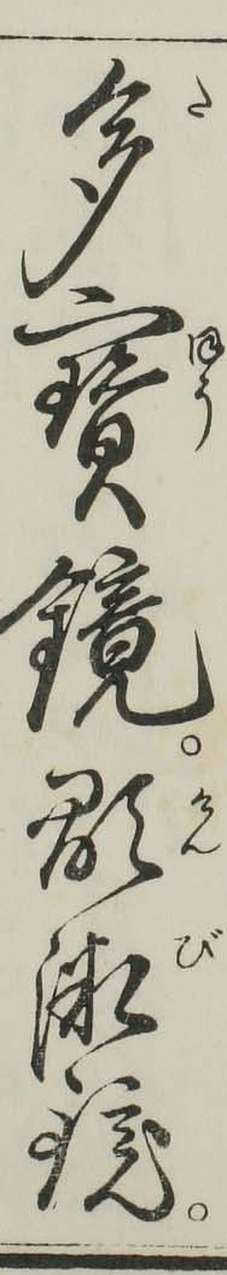多宝鏡。顕微鏡。
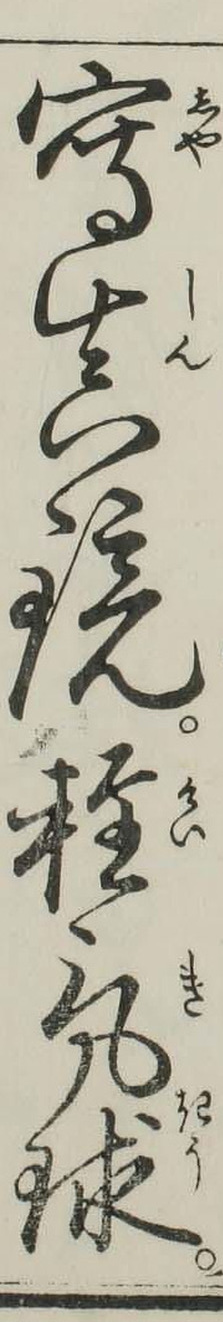写真鏡。軽気球。
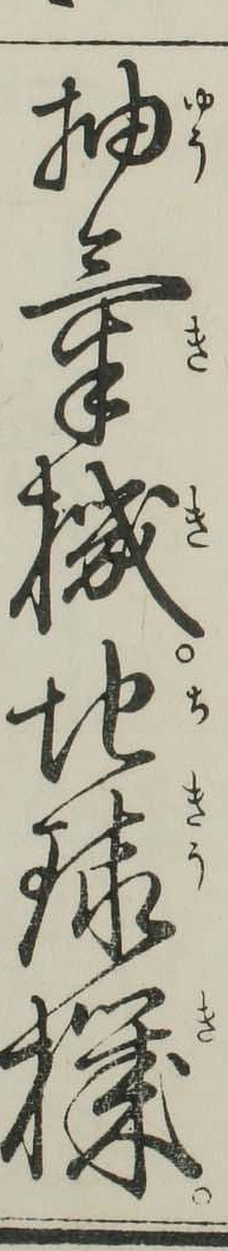抽気機。地球機。
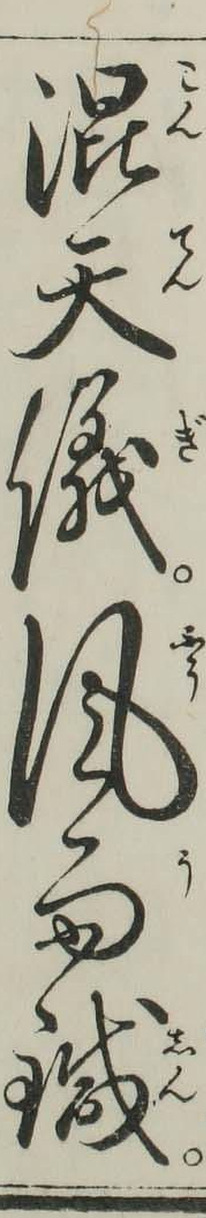混天儀。風雨鍼。

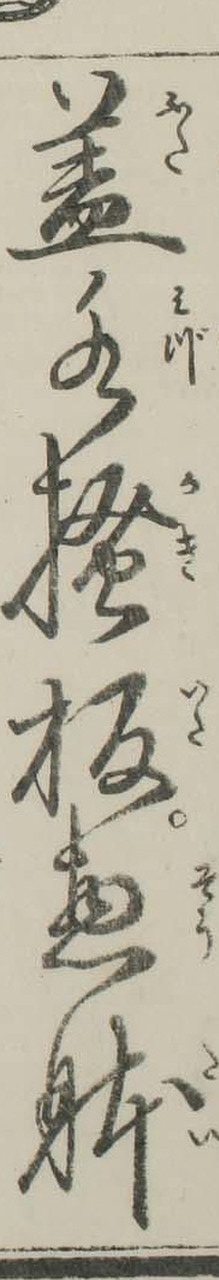蓋水掻板。惣体
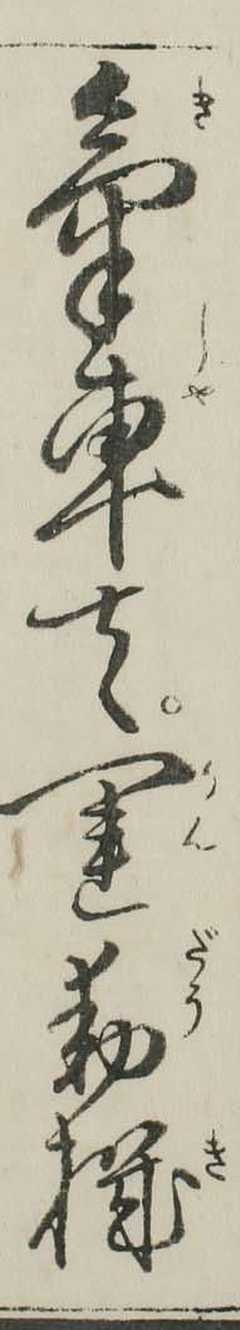気車は。運動機
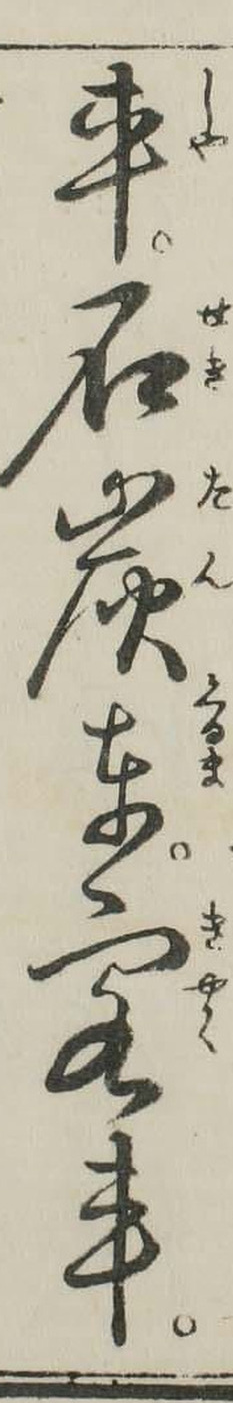車。石炭車。客車。
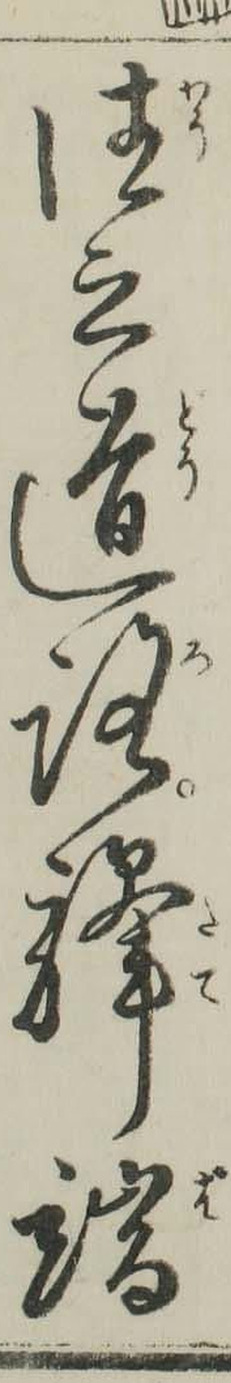往之道路。駅端

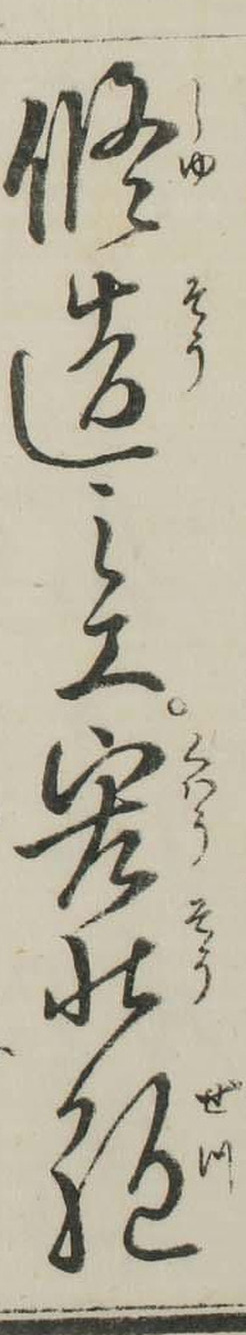修造之工。宏壮絶
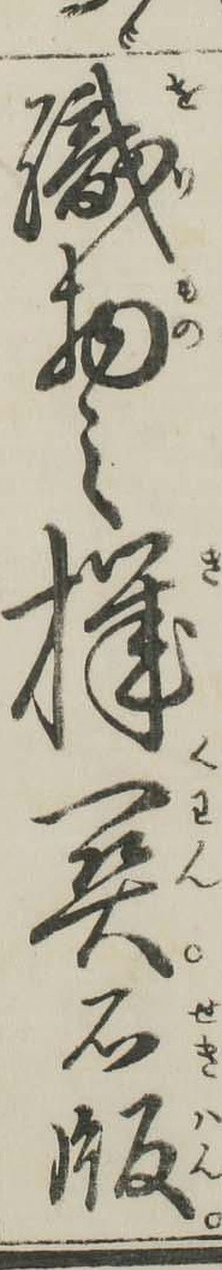織物之機関。石版。
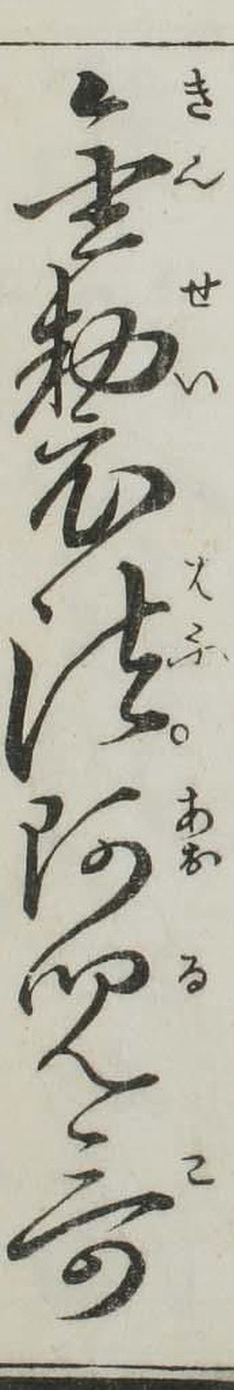金製法。阿児哥
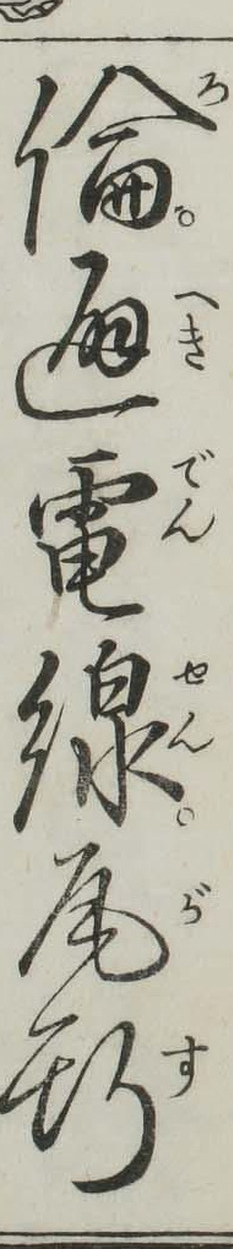倫。避電線。瓦斯
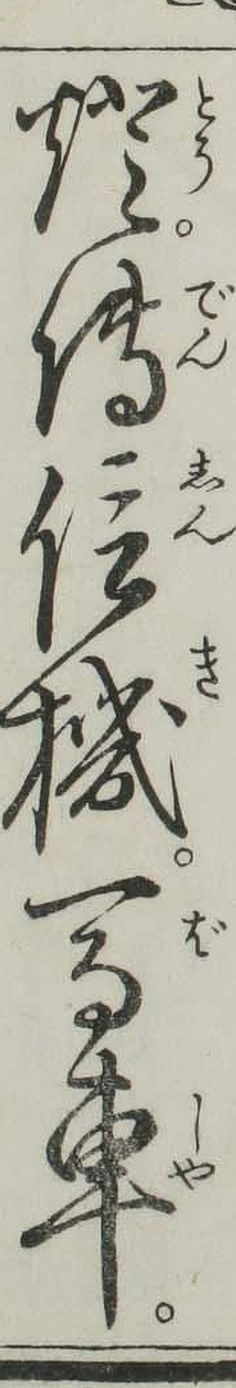燈。伝信機。馬車。
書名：開化往来
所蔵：東京学芸大学教育コンテンツアーカイブ
